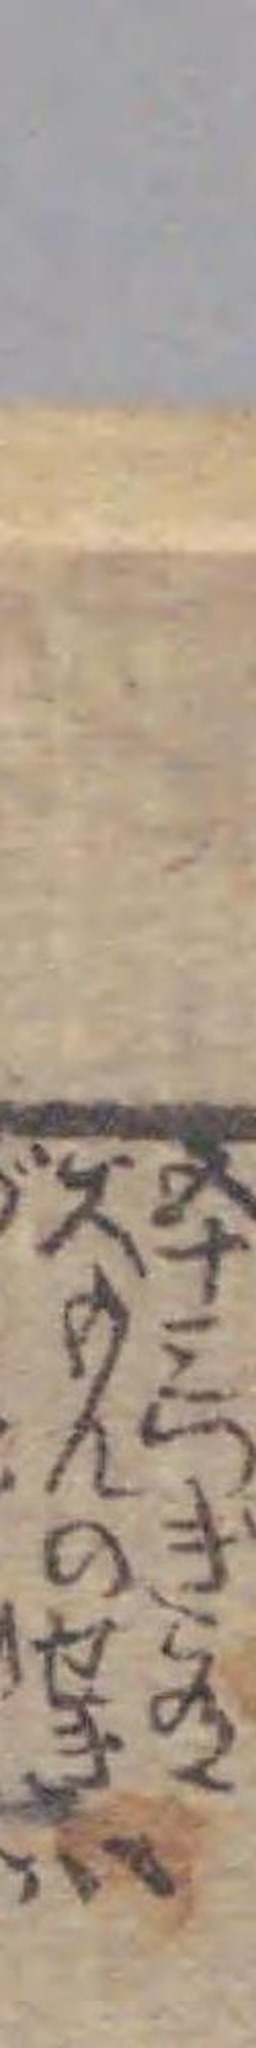大もんのせき
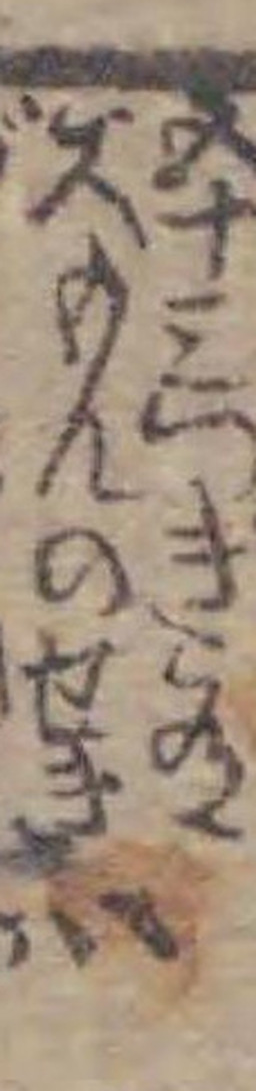大もんのせき
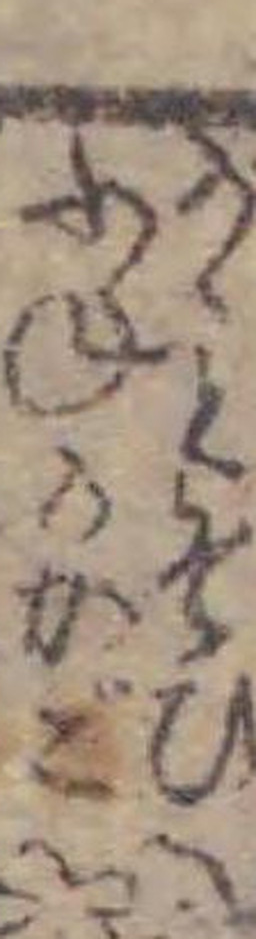ふねかかご
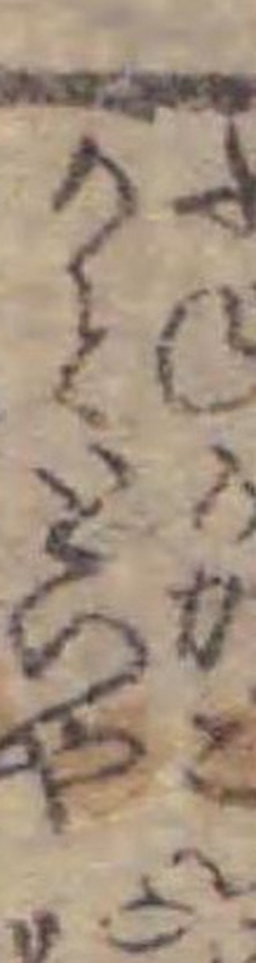かとといや
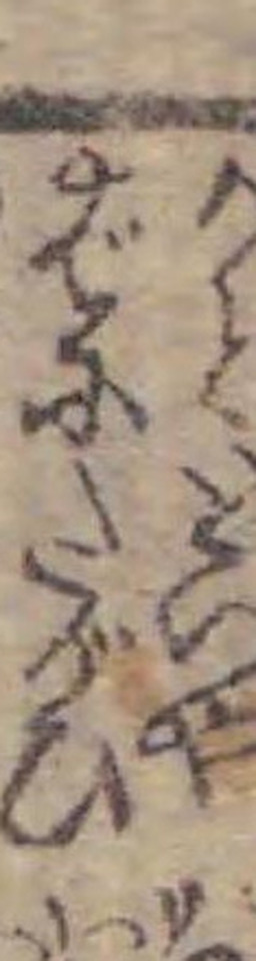ばにたがひ
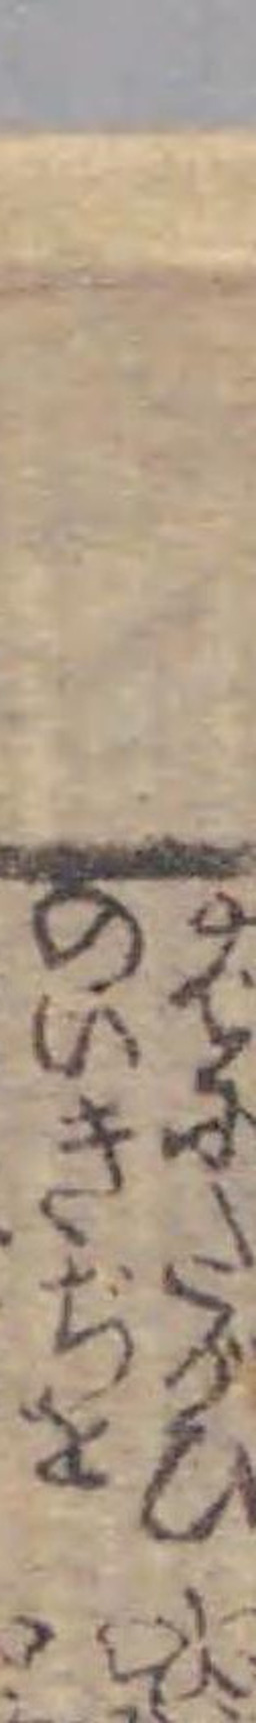のいきぢを
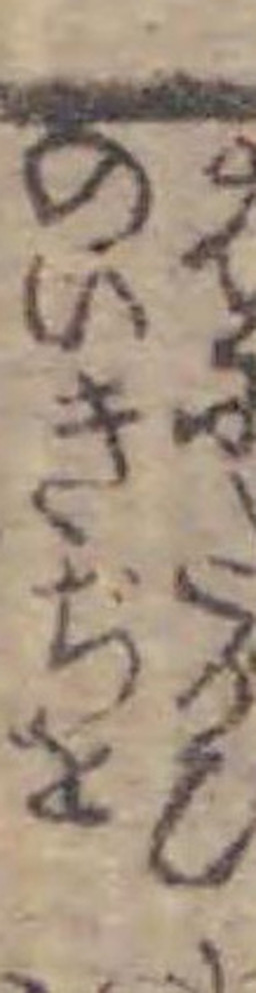のいきぢを
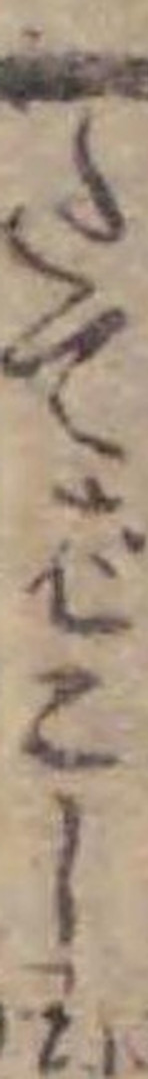たてばこし
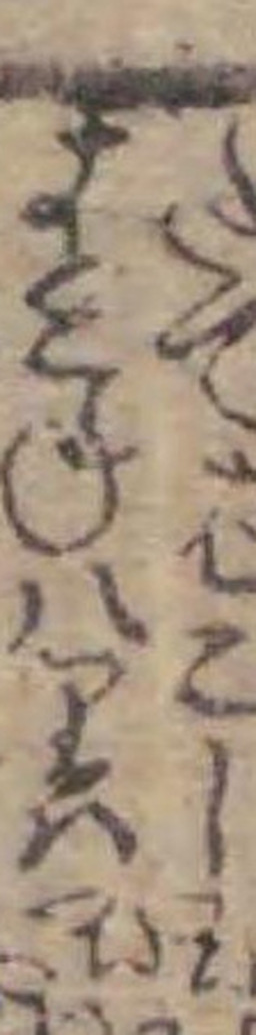はこね八里は
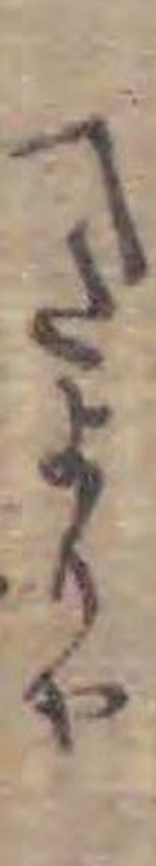〽たよりや
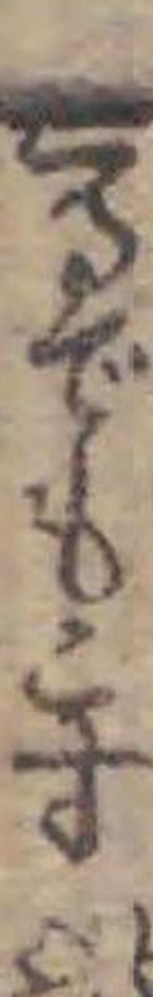馬でもこす
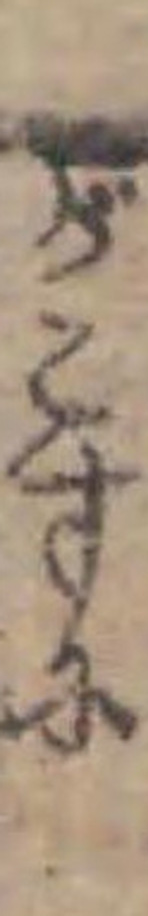がこすに
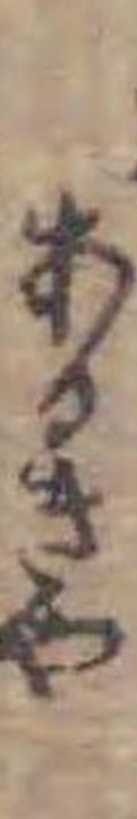あるきや
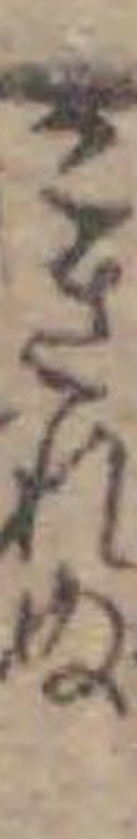こされぬ
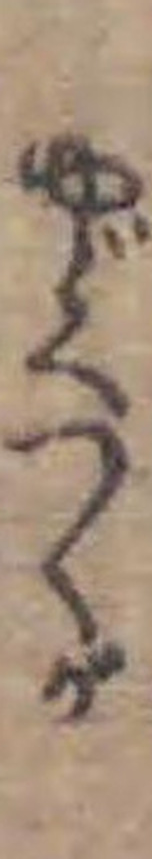やどへつくが
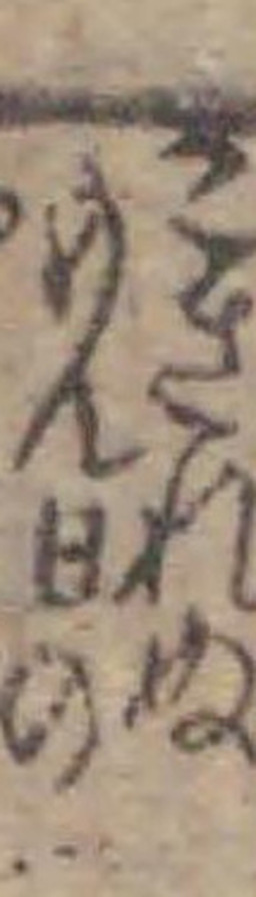もん日の
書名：北国順礼唄方便 : 3巻
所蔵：国立国会図書館 National Diet Library, JAPAN
